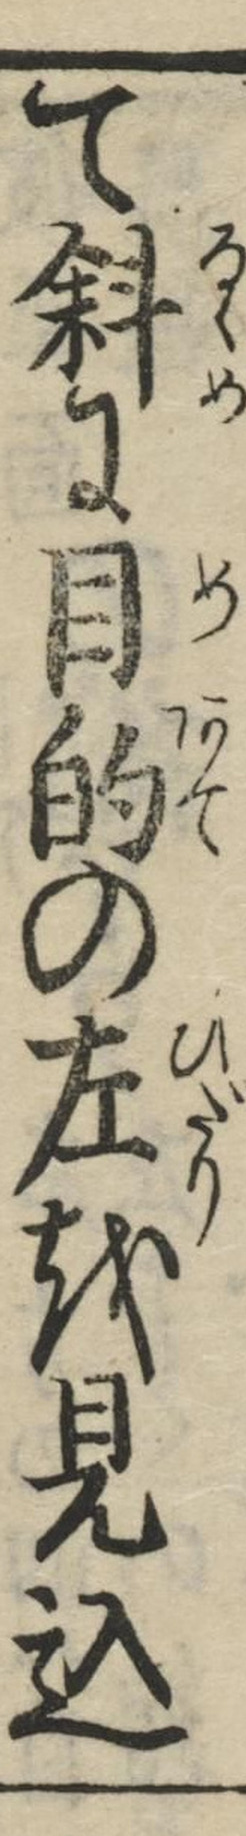て斜に目的の左を見込
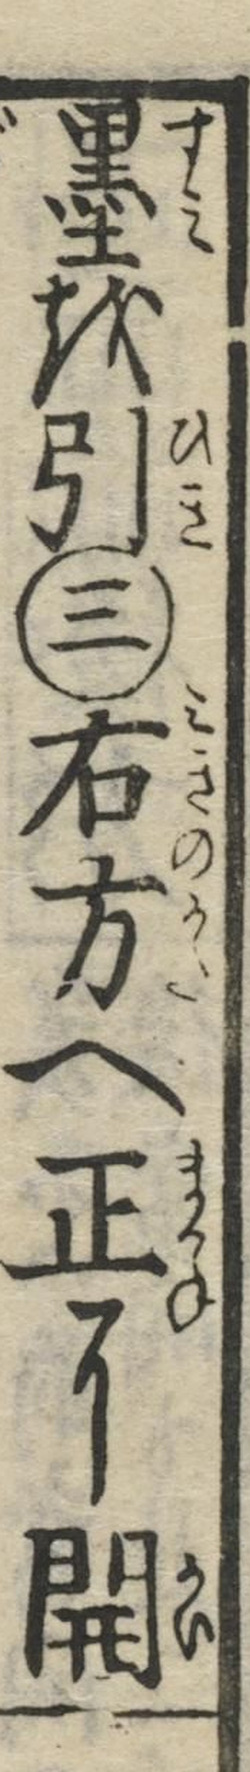墨を引㊂右方へ正に開
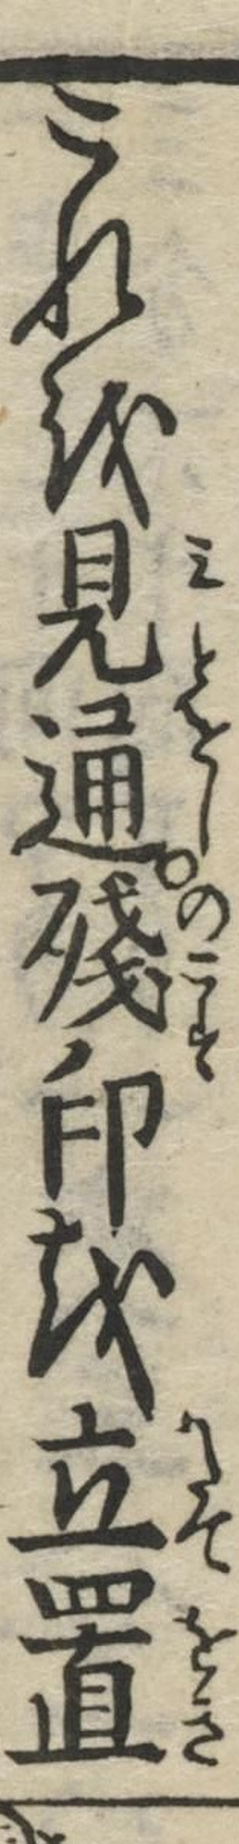これを見通。残印を立置
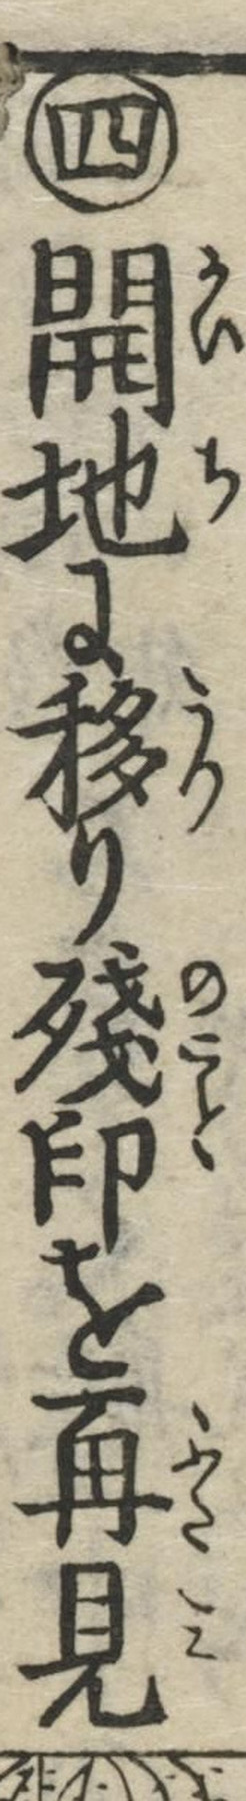㊃開地に移り残印を再見
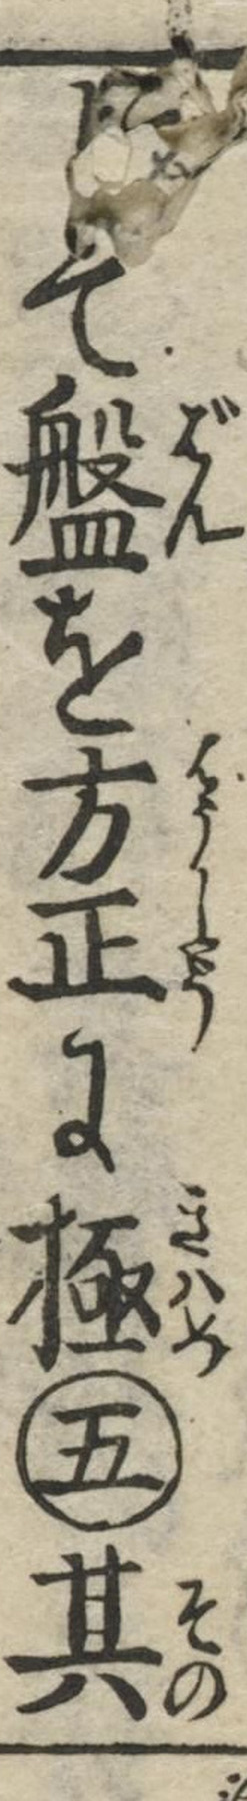して盤を方正に極㊄其
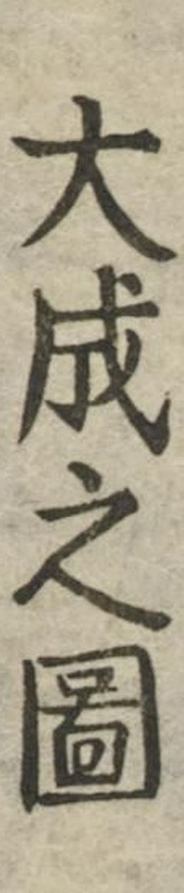大成之図
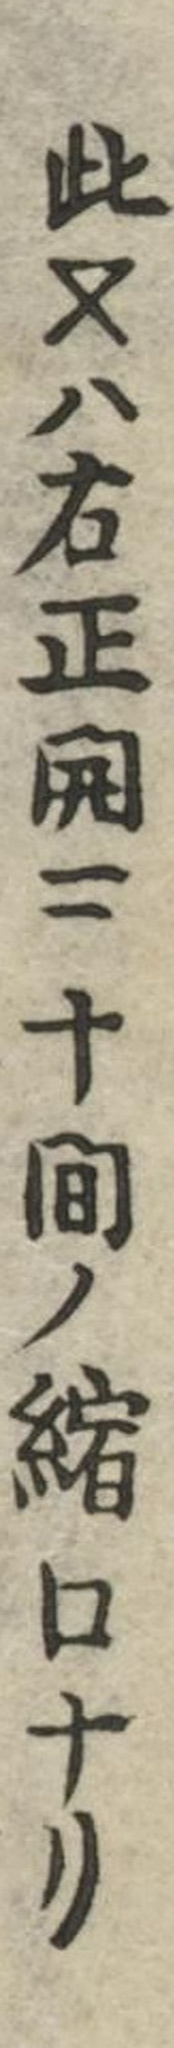此▽△ハ右正開二十間ノ縮口ナリ
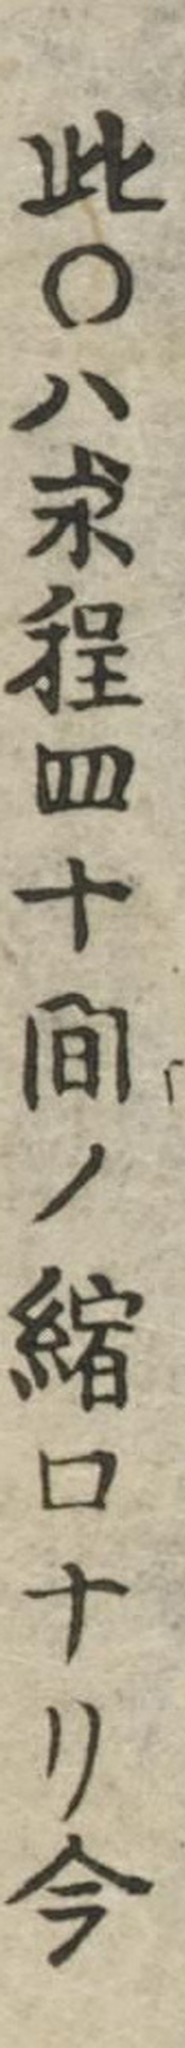此○ハ求程四十間ノ縮口ナリ今
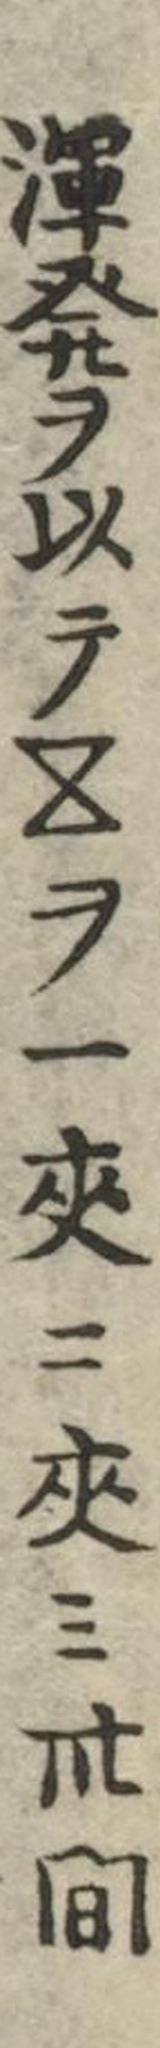渾発ヲ以テ▽△ヲ一夾ニ夾ミ卅間
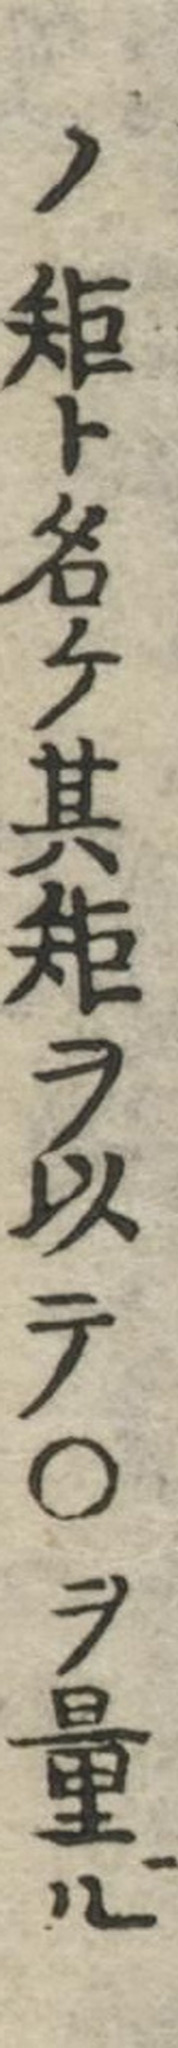ノ矩ト名ケ其矩ヲ以テ○ヲ量ル
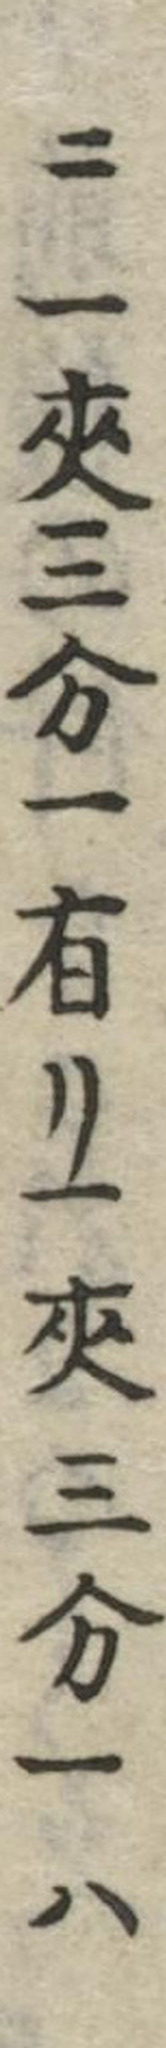ニ一夾三分一有リ一夾三分一ハ
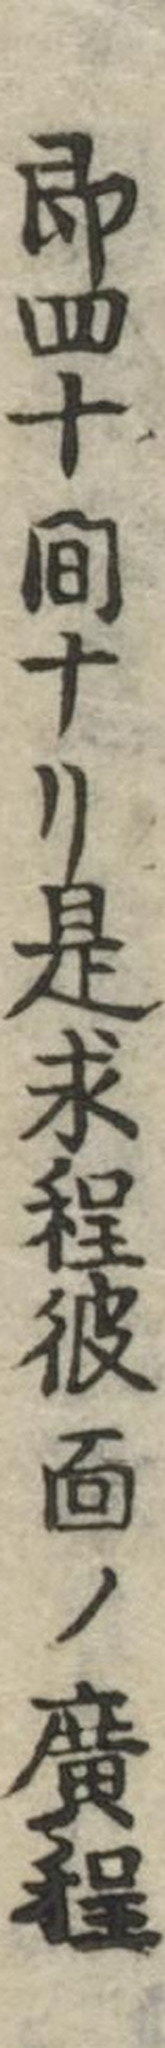即四十間ナリ是求程彼面ノ広程
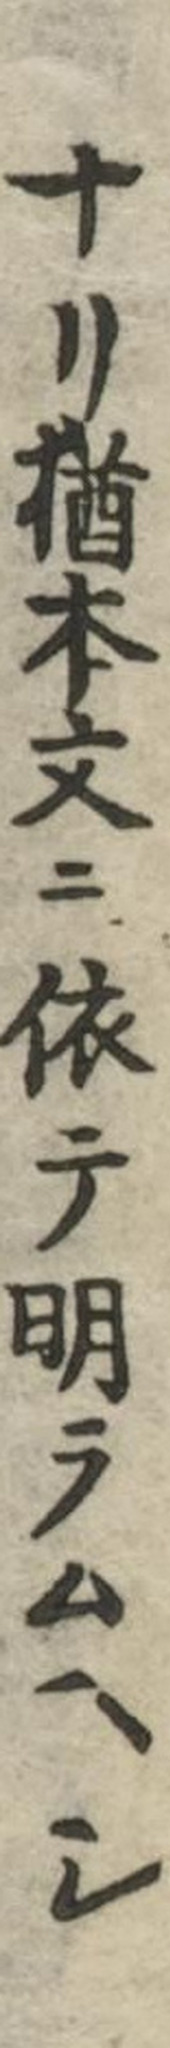ナリ猶本文ニ依テ明ラムヘシ

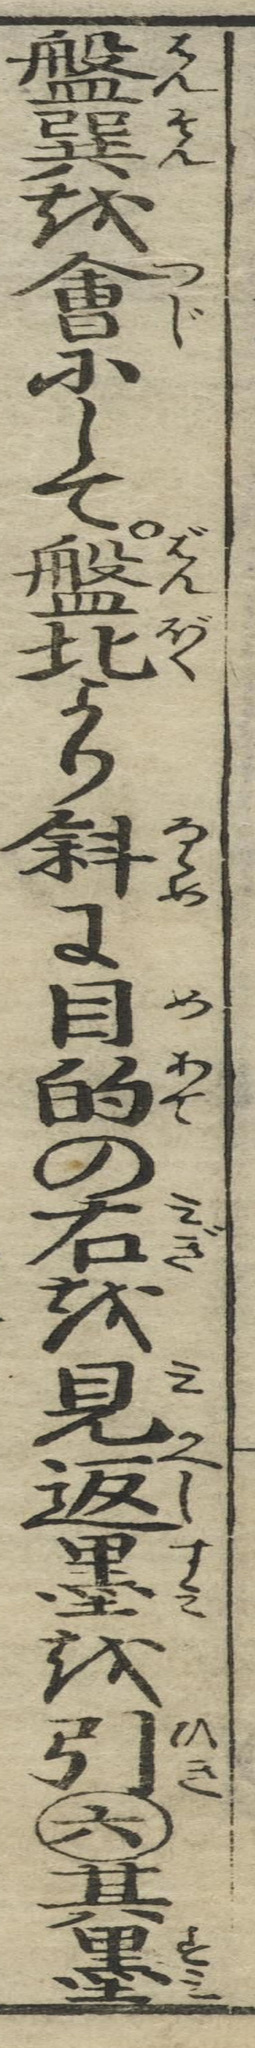盤巽を会にして。盤北より斜に目的の右を見返墨を引㊅其墨
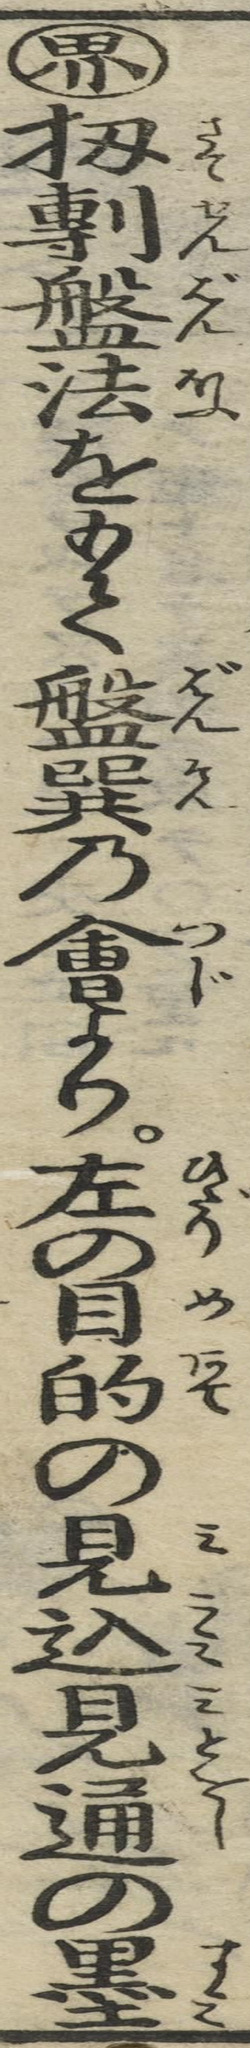界扨剸盤法をもて盤巽の会より。左の目的の見込見通の墨
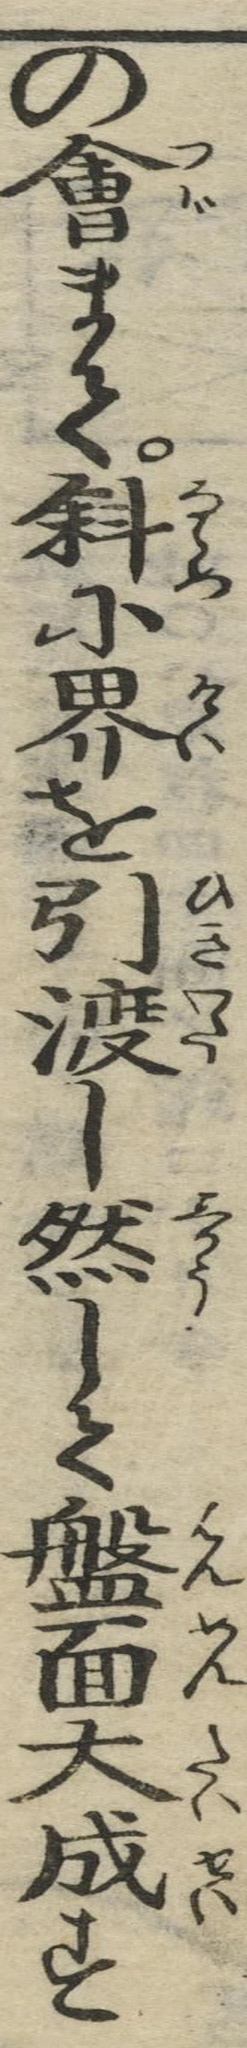の会まて。斜に界を引渡し然して盤面大成す
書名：量地指南　巻之三（内題）
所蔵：東京大学地震研究所図書室 Earthquake Research Institute Library, The University of Tokyo, JAPAN
